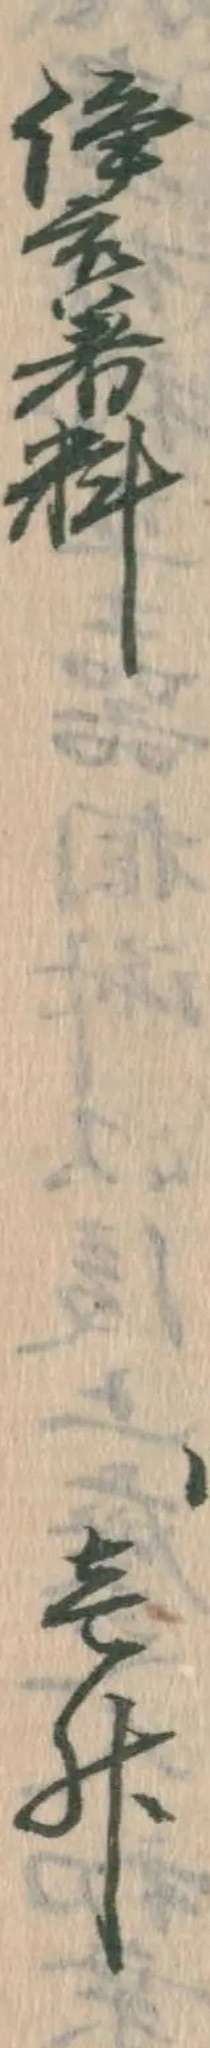浄衣着料壱升
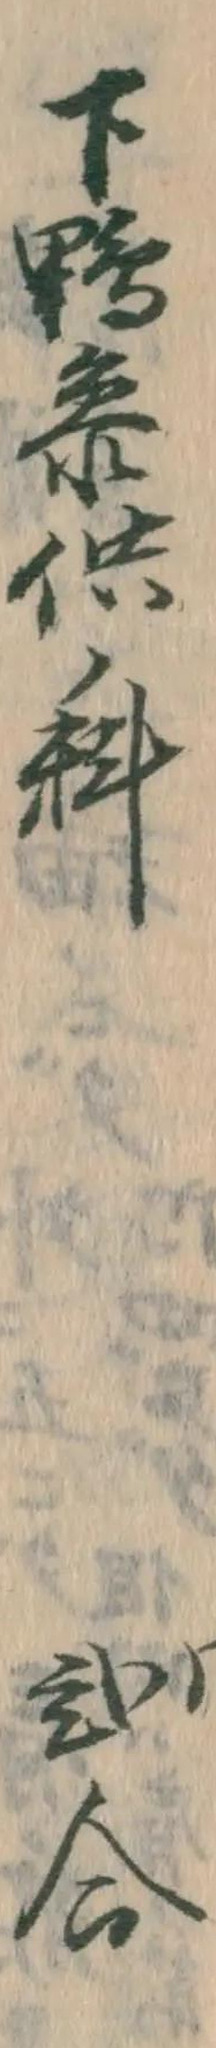下鴨参供ノ料弐合
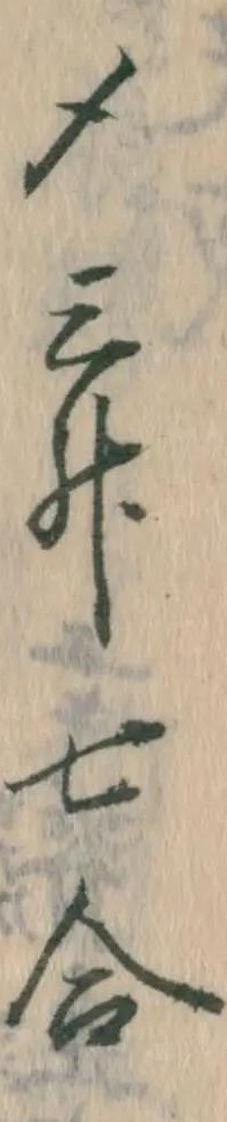〆三升七合
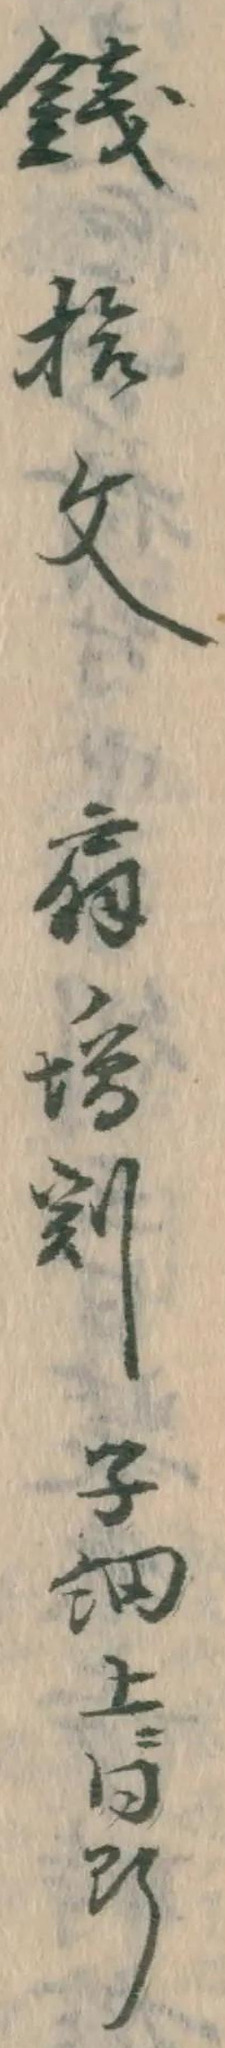銭拾文扇ノ増割子細上ニ同断
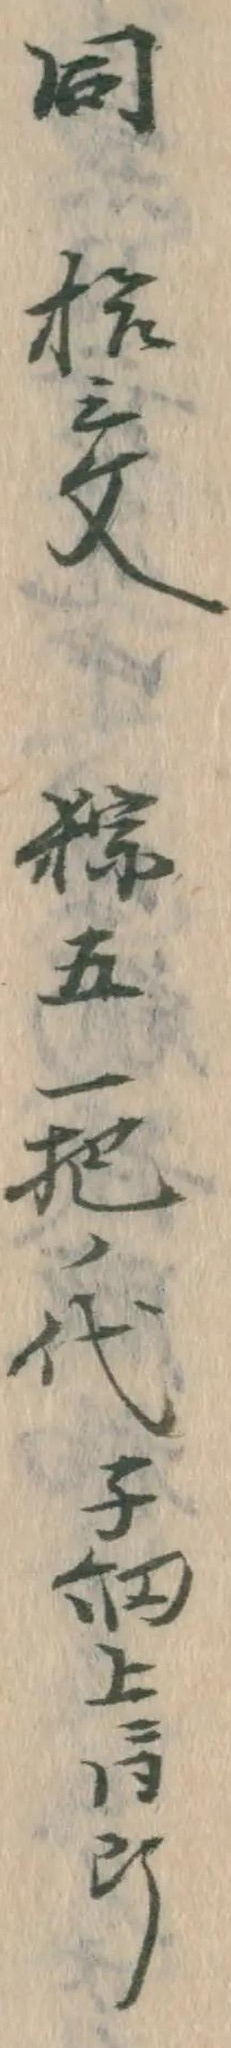同拾三文粽五一把ノ代子細上ニ同断
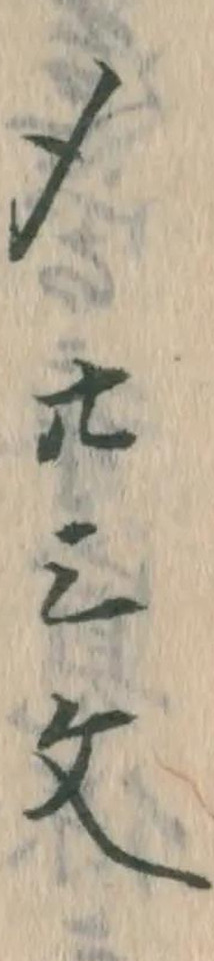〆廿三文
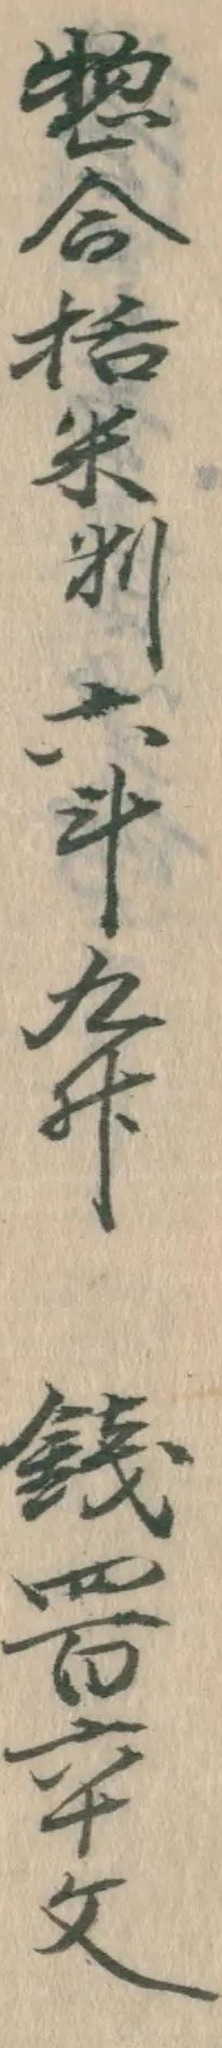惣合括米判六斗九升銭四百六十文
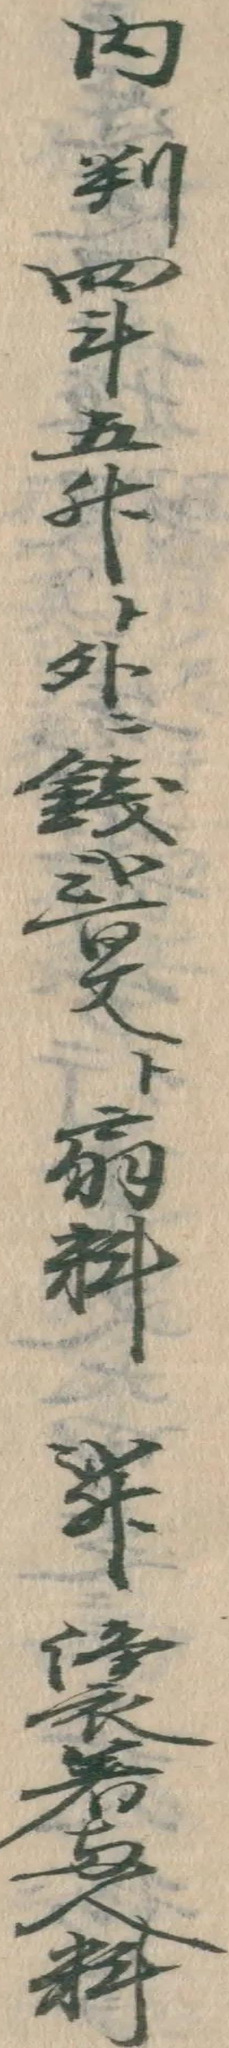内判四斗五升ト外ニ銭弐百文ト扇料弐升浄衣着両人料
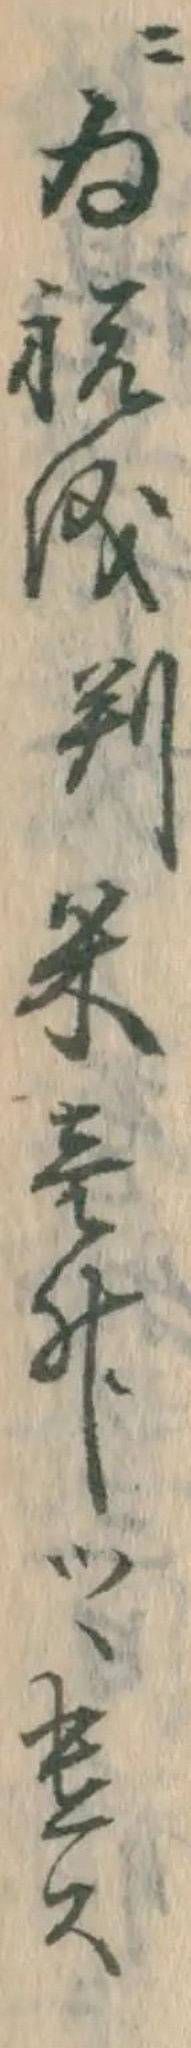ニ為祝儀判米壱升ツヽ遣ス

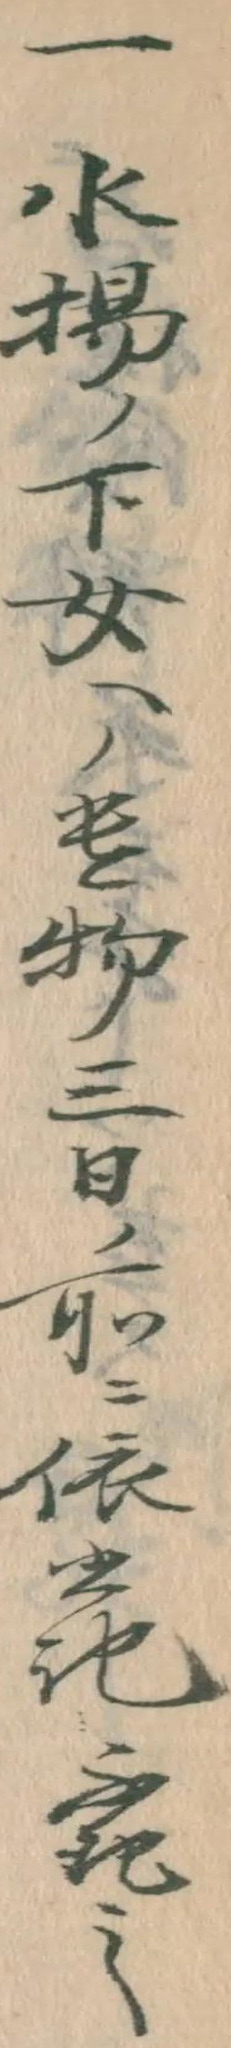一水揚ノ下女ヘノ遣物三日ノ所ニ依書記不記之
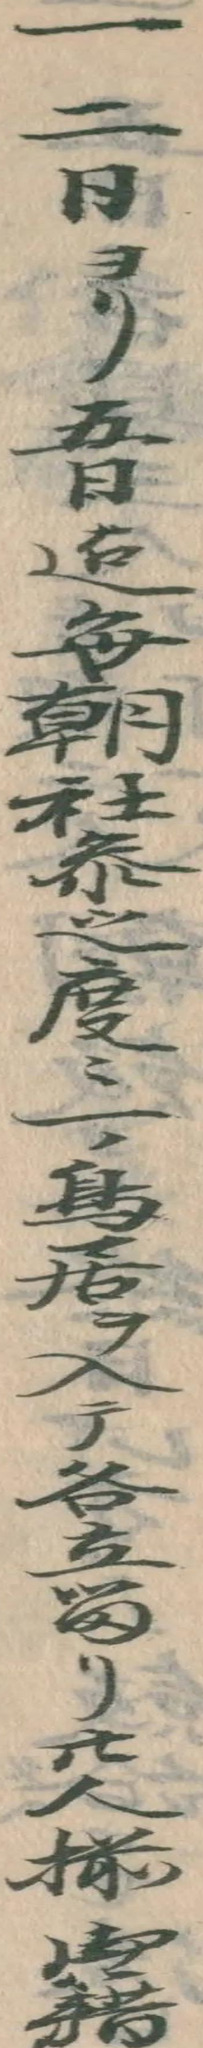一二日ヨリ五日迄毎朝社参之度々一ノ鳥居ヲ入テ各立留リ廿人揃御籍
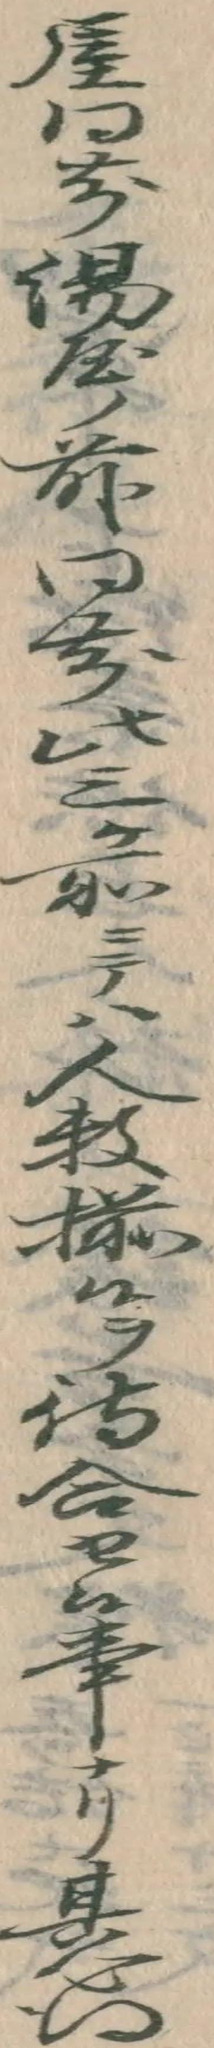屋同前湯屋ノ前同前此三ヶ所ニテハ人数揃候ヲ待合セ候事ナリ其心得
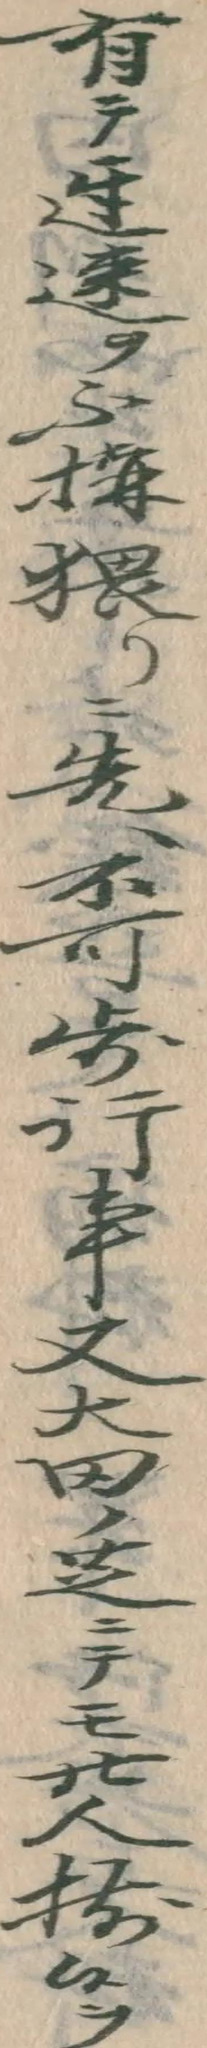有テ遅速ヲ不構猥リニ先へ不可歩行事又大田ノ芝ニテモ廿人揃候ヲ
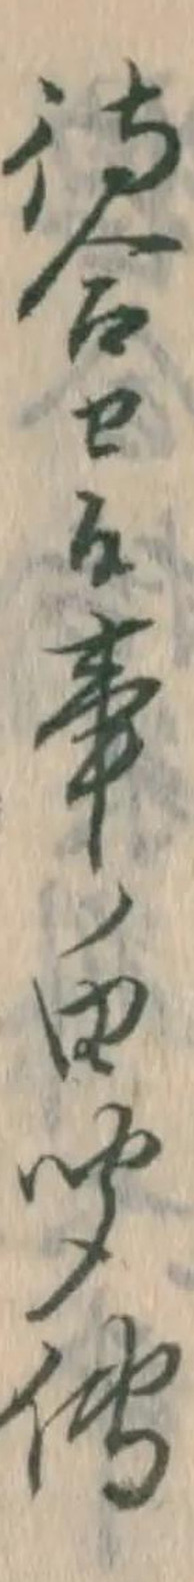待合セる事ノ由聞伝
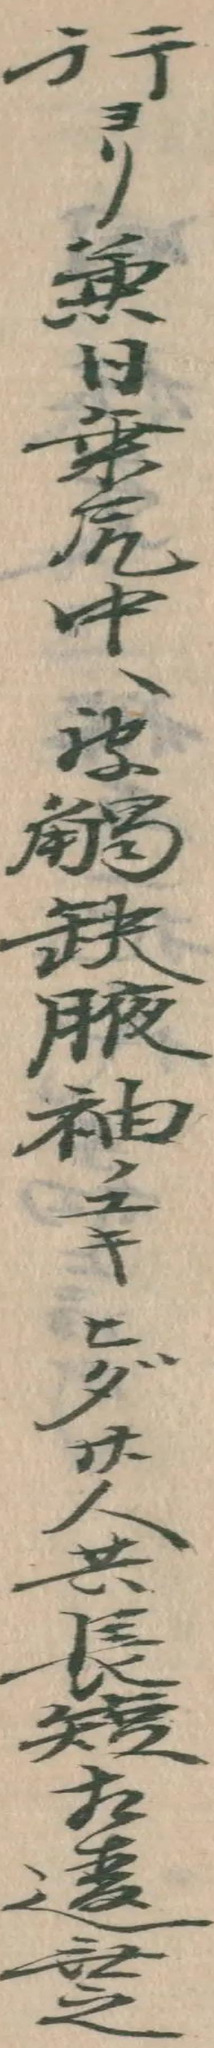行ヨリ兼日乗尻中へ被触缺腋袖ノユキヒダ廿人共長短相違無之
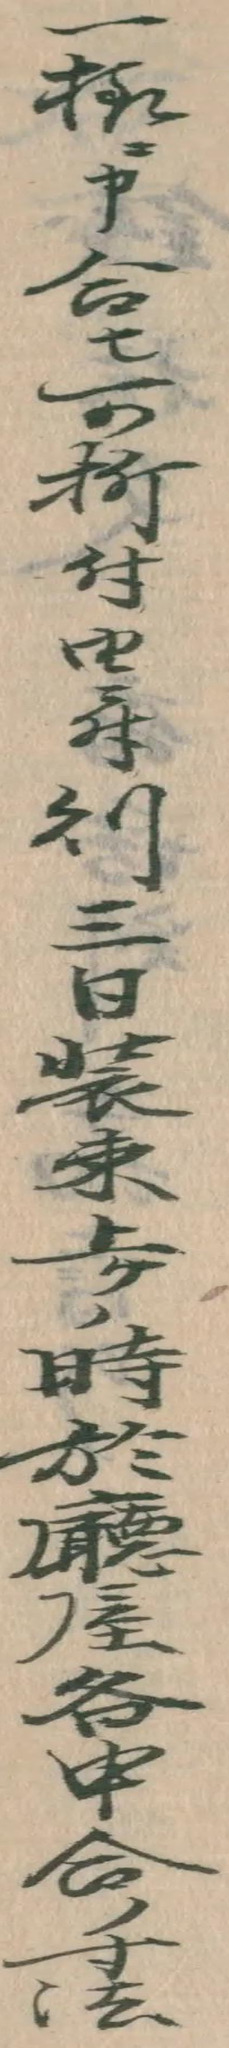一様ニ申合セ可折付由ニ付則三日装束上ケノ時於庁屋各申合ノ寸法
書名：賀茂社記録. 第11冊
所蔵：国立国会図書館 National Diet Library, JAPAN
